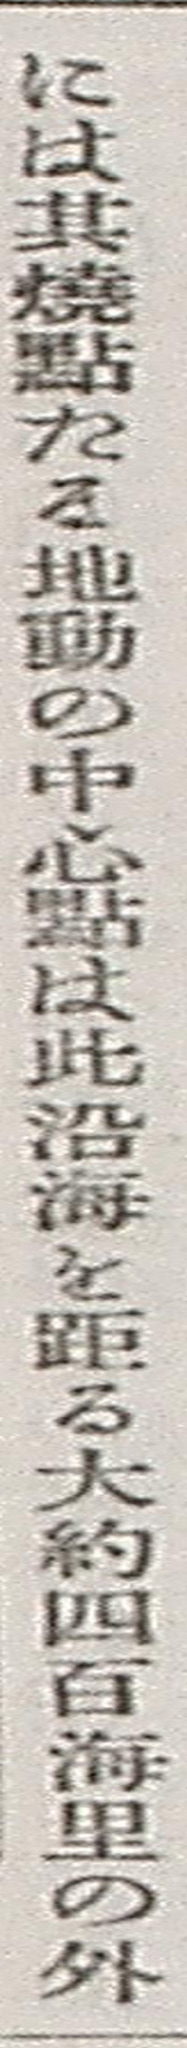には其焼点たる地動の中心点は此沿海を距る大約四百海里の外
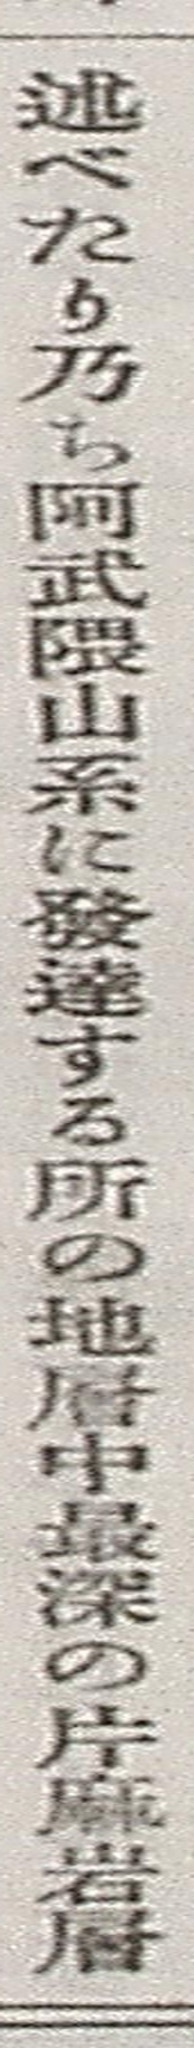述べたり乃ち阿武隈山系に発達する所の地層中最深の片麻岩層
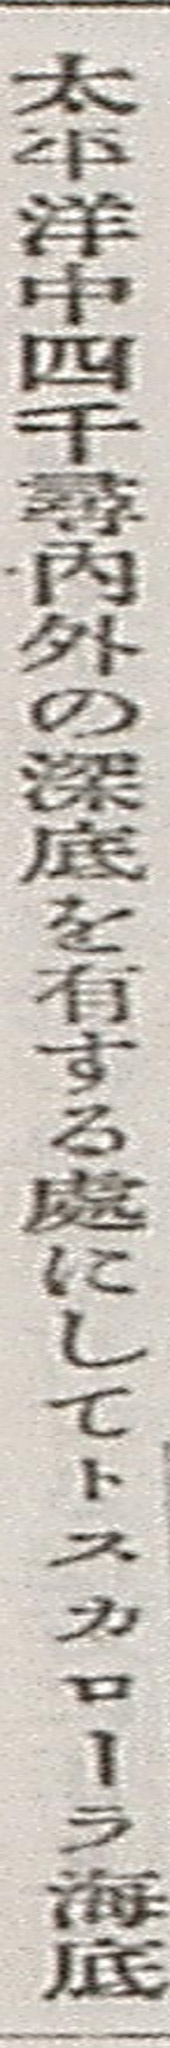太平洋中四千尋内外の深底を有する処にしてトスカローラ海底
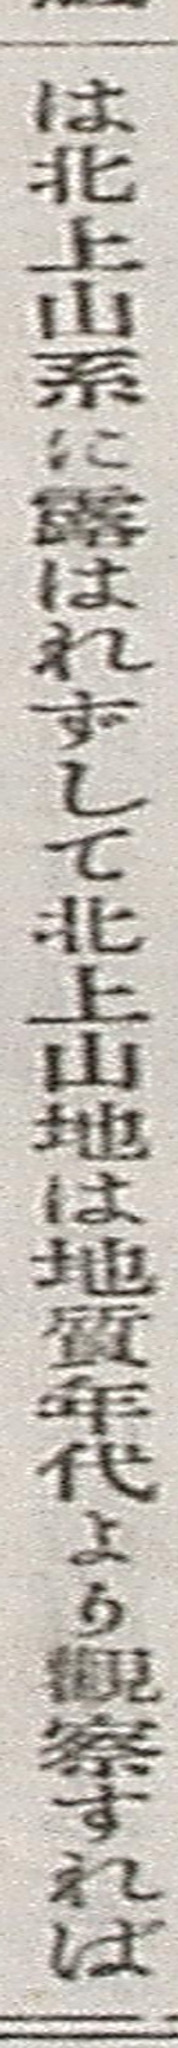は北上山系に露はれずして北上山地は地質年代より観察すれば
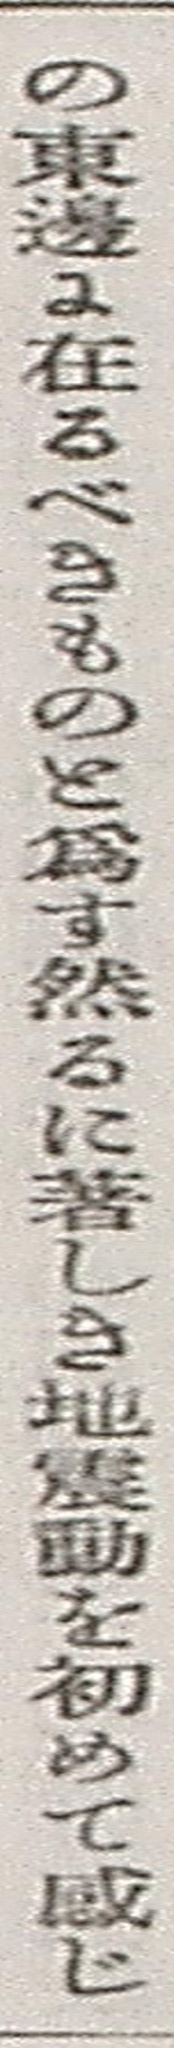の東辺に在るべきものと為す然るに著しき地震動を初めて感じ
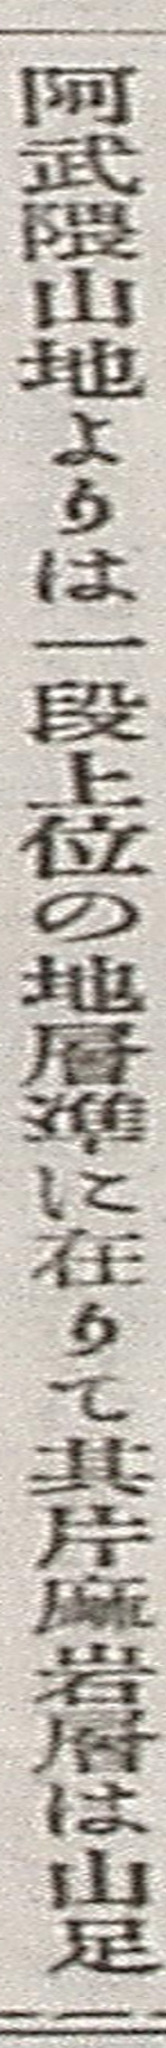阿武隈山地よりは一段上位の地層準に在りて其片麻岩層は山足
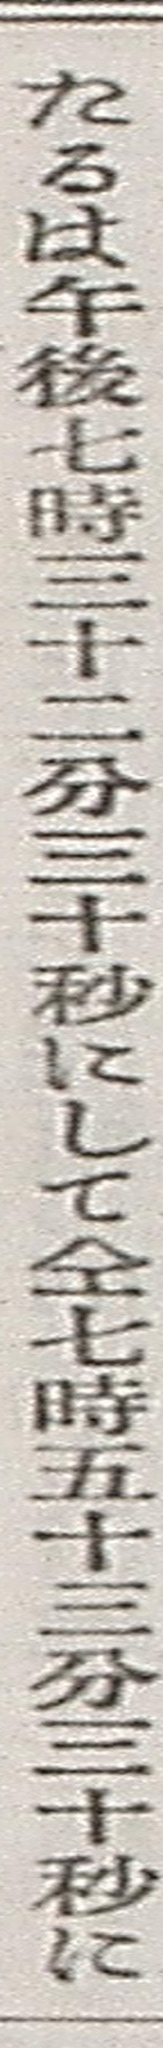たるは午後七時三十二分三十秒にして同七時五十三分三十秒に
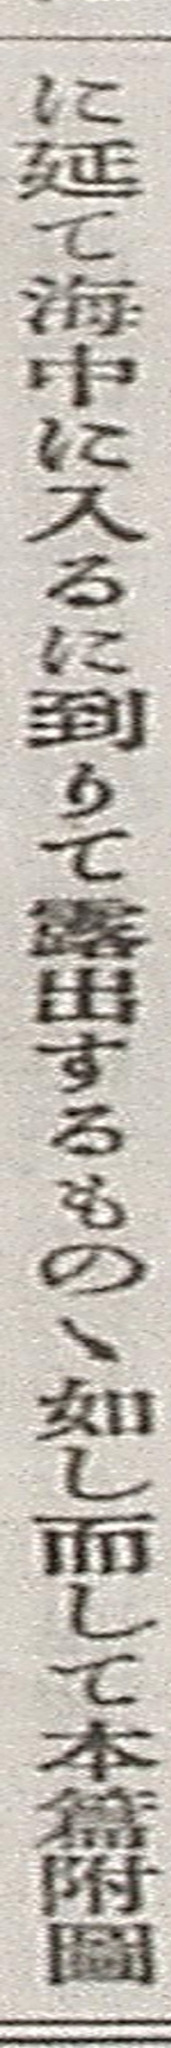に延て海中に入るに到りて露出するものゝ如し而して本篇付図
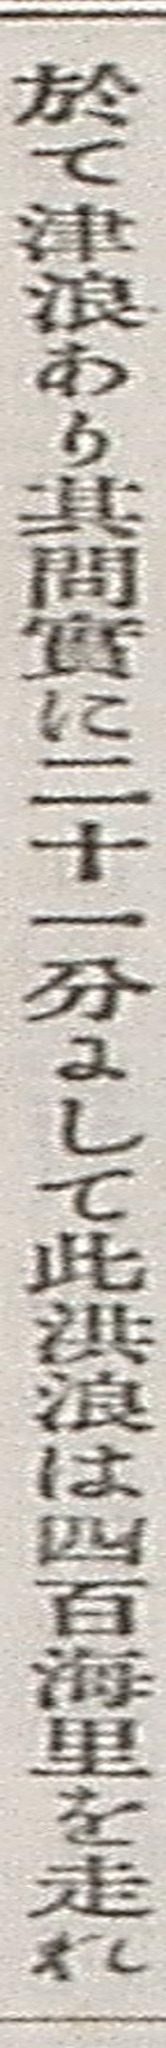於て津浪あり其間実に二十一分にして此洪浪は四百海里を走れ
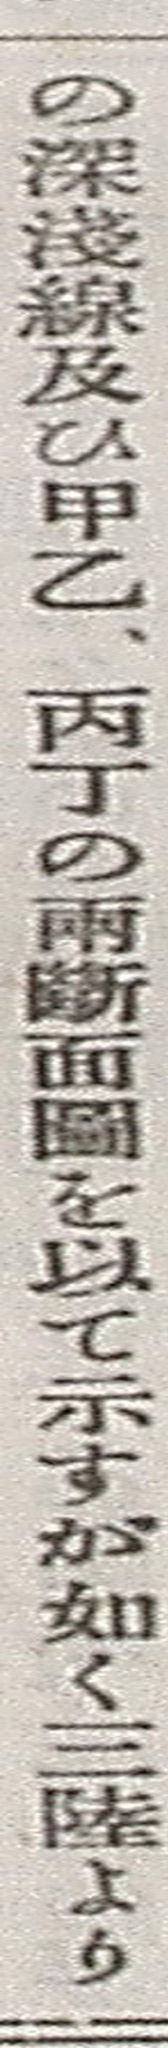の深浅線及ひ甲乙、丙丁の両断面図を以て示すが如く三陸より
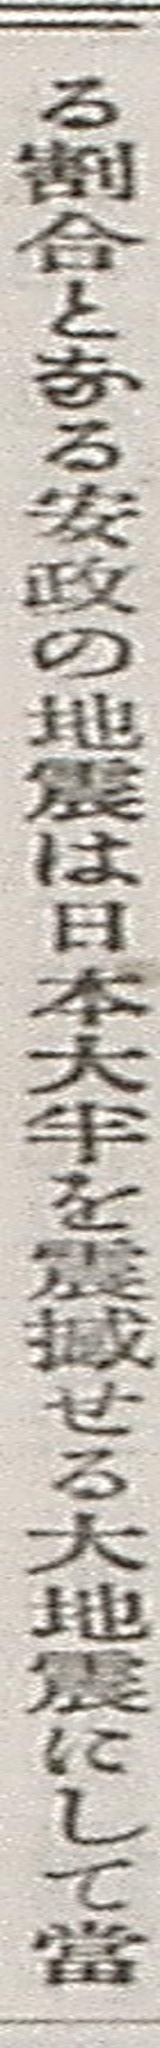る割合となる安政の地震は日本大半を震撼せる大地震にして当
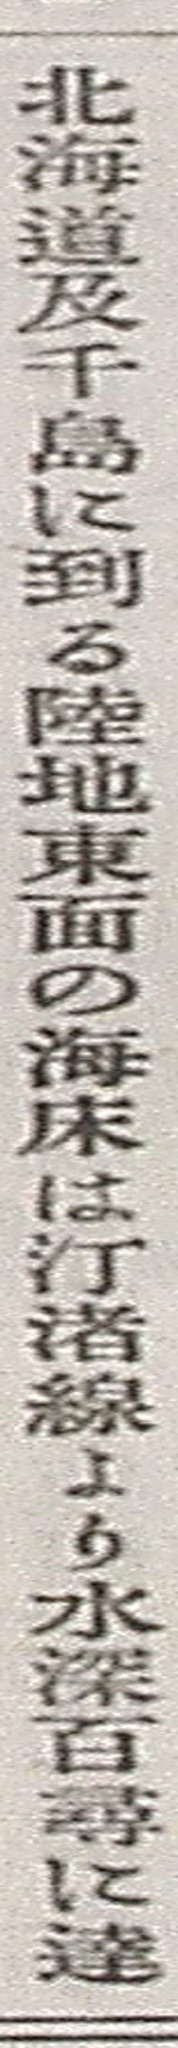北海道及千島に到る陸地東面の海床は汀渚線より水深百尋に達
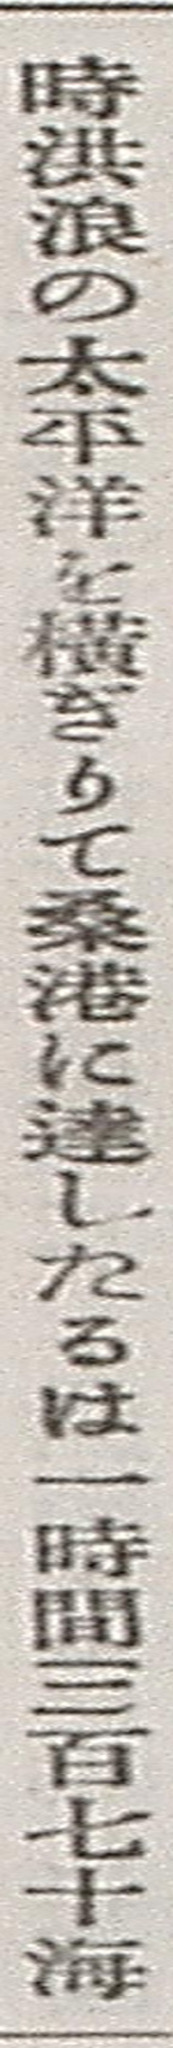時洪浪の太平洋を横ぎりて桑港に達したるは一時間三百七十海
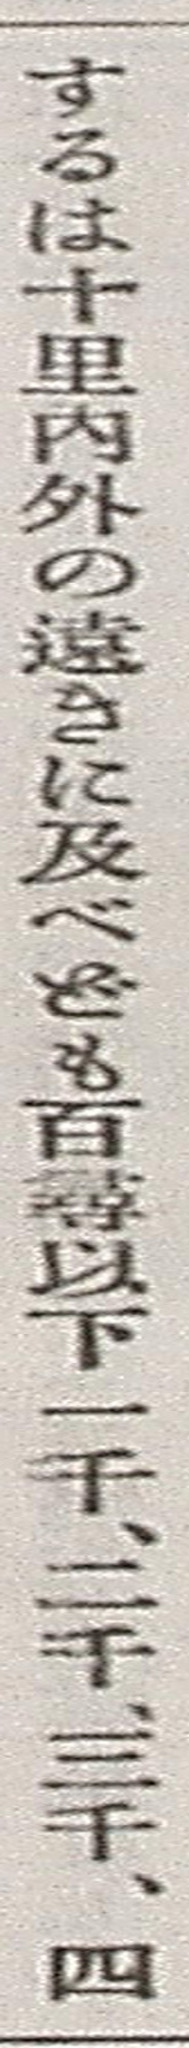するは十里内外の遠きに及べども百尋以下一千、二千、三千、四
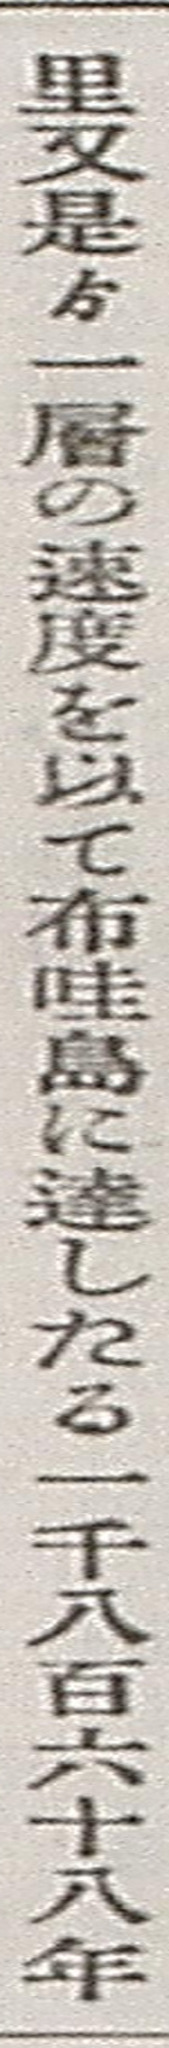里又是ゟ一層の速度を以て布哇島に達したる一千八百六十八年
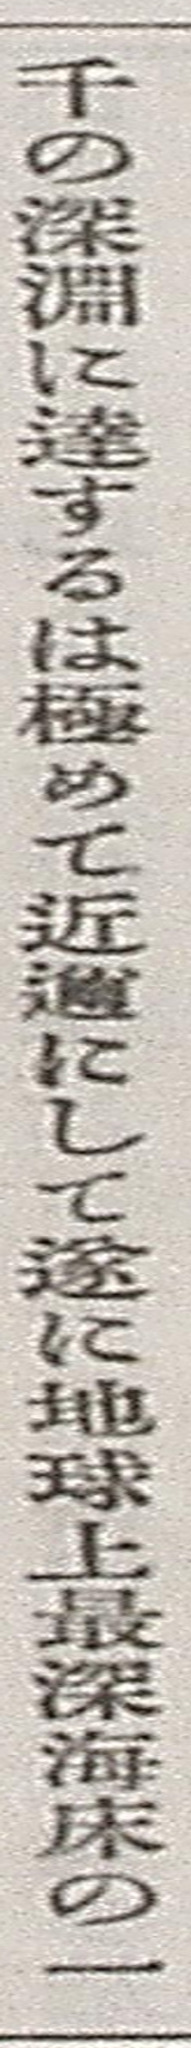千の深淵に達するは極めて近邇にして遂に地球上最深海床の一
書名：風俗畫報臨時増刊第百二十號　大海嘯被害録（下）
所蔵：東京大学地震研究所図書室 Earthquake Research Institute Library, The University of Tokyo, JAPAN
